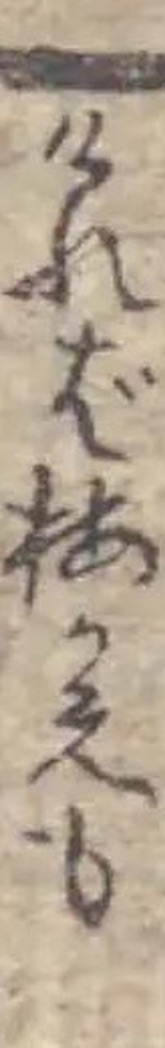ければ梅かえも
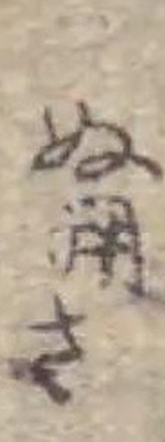ぬ用さ
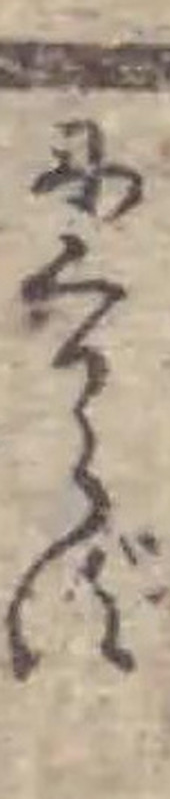にくからず
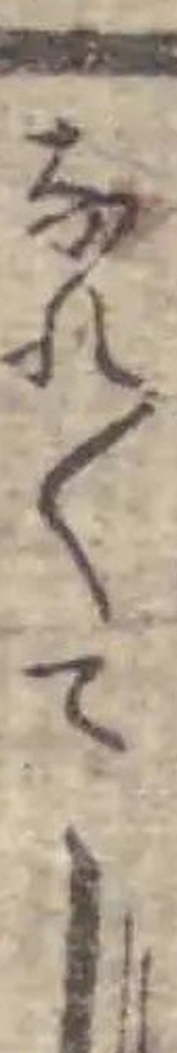なれ〳〵て
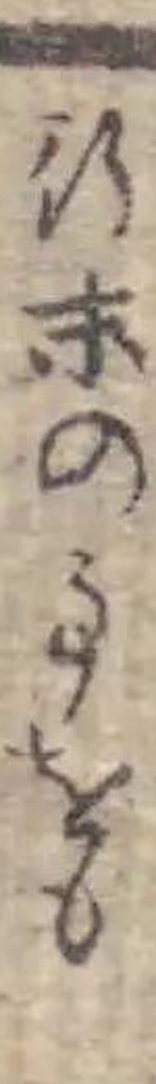行末の事をも
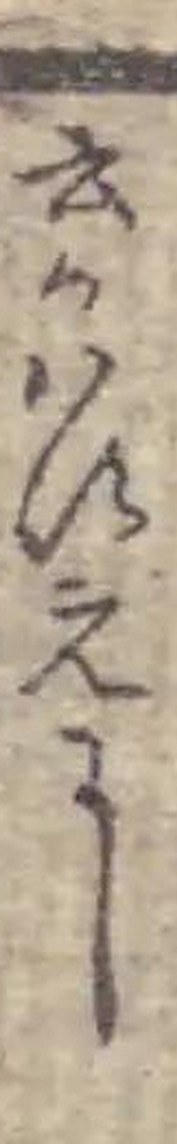云かはすえにし
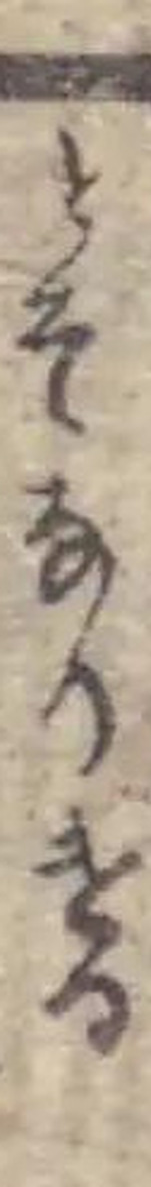とそなりける
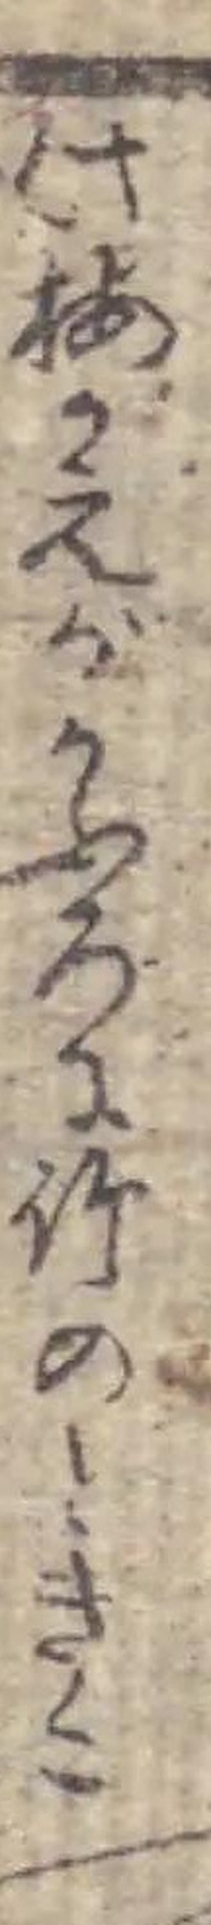此梅かえがかふろに竹のときこ
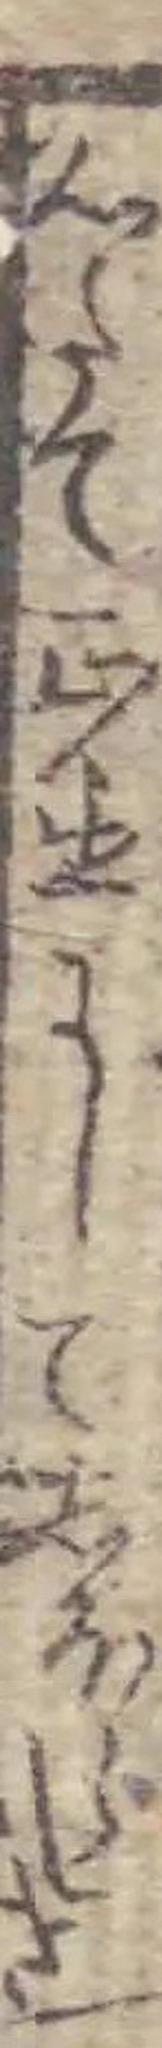心たて正直にしてしほらしき
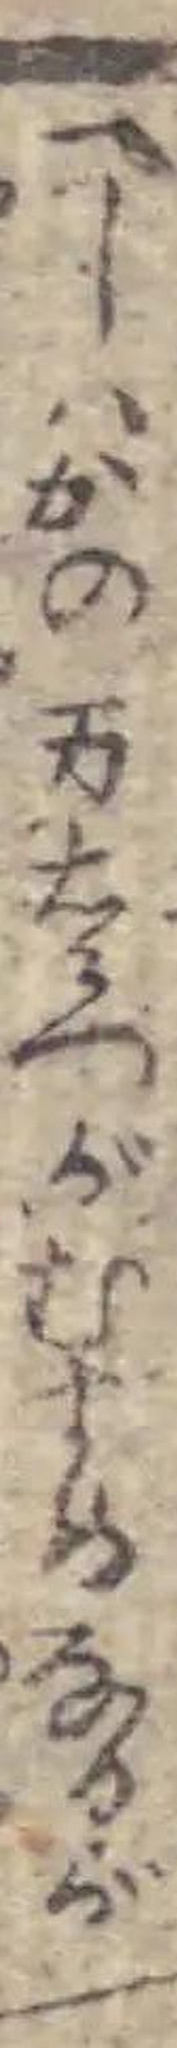へしはかの万右衛門がむすめなるが
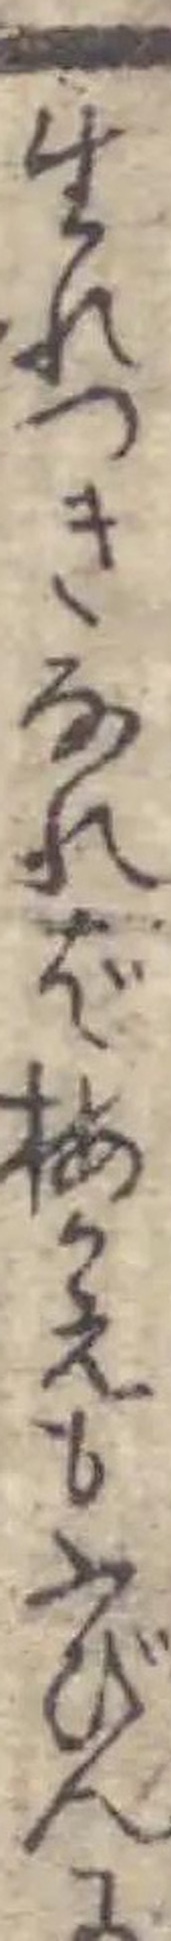生れつきなれば梅かえもふびんに
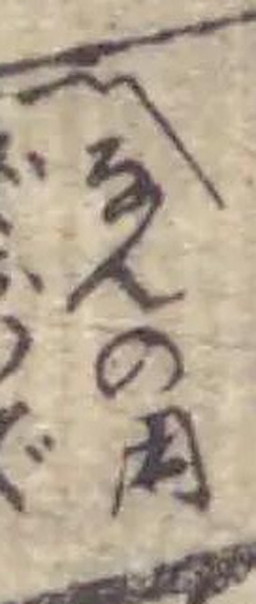〽なんの用
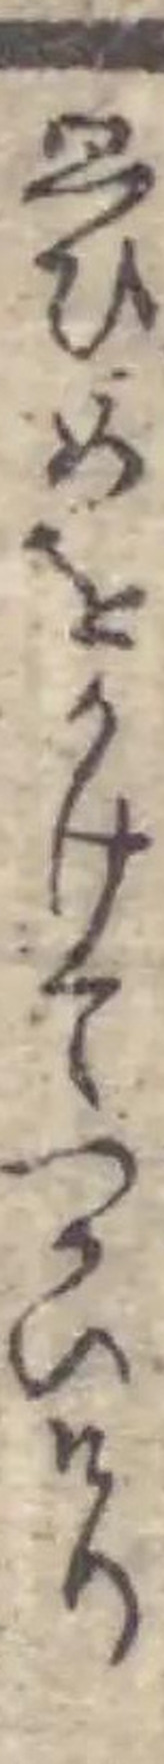思ひめをかけてつかいけり
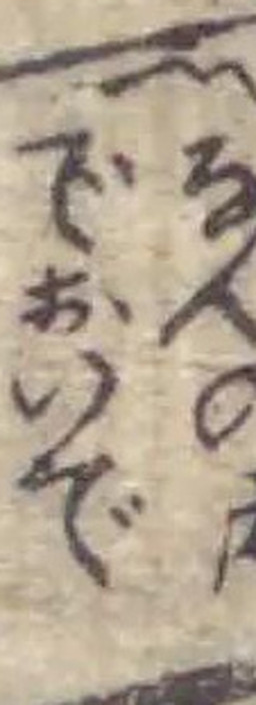でおいで
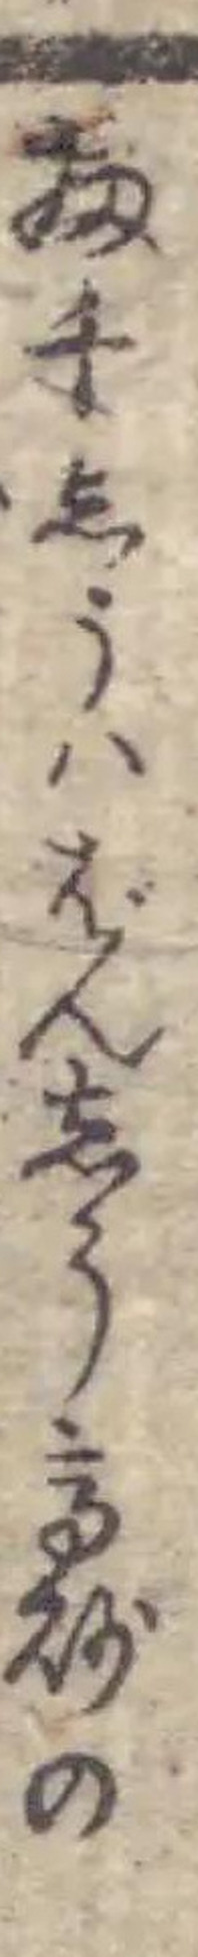扨千しうはばんしう高砂の
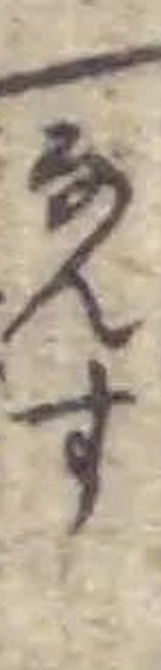なんす
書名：見立蓬莱 : 2巻
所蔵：国立国会図書館 National Diet Library, JAPAN
